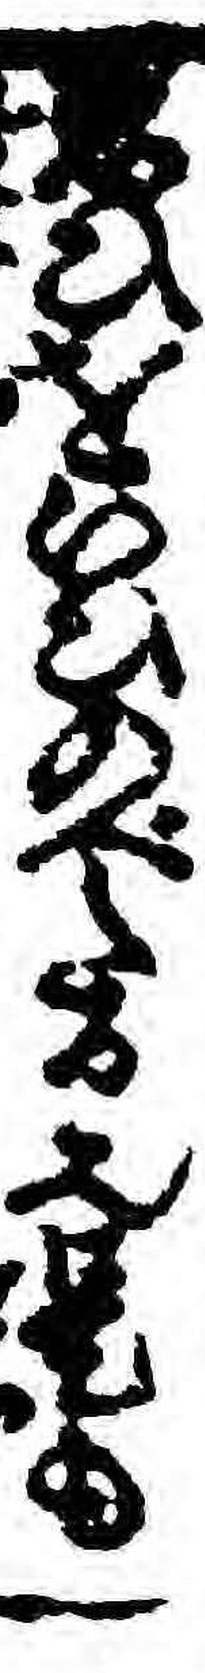思ひをいひのべたる也是も
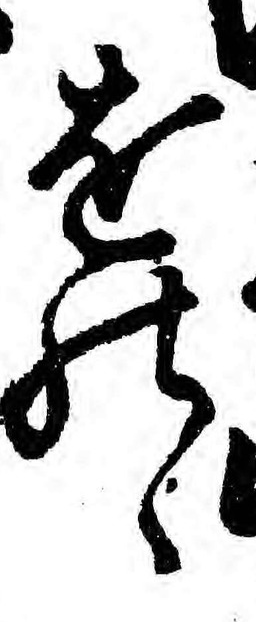をのゝ
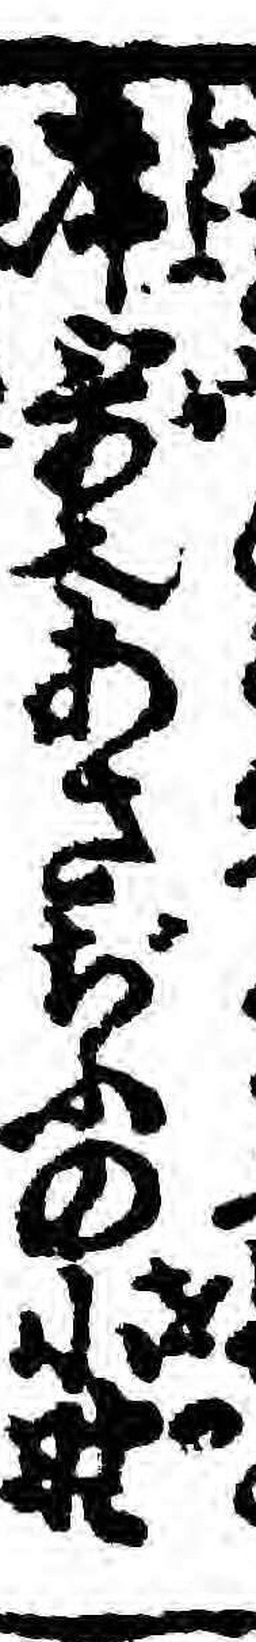序哥也あさぢふの小野
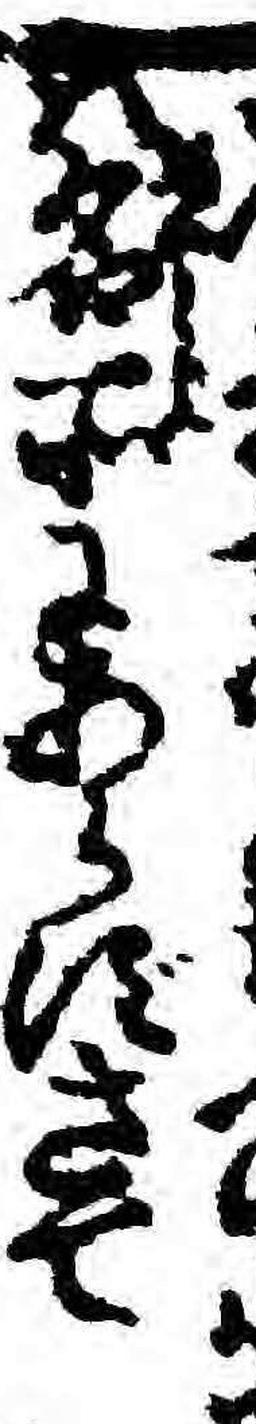は名所にあらずさて
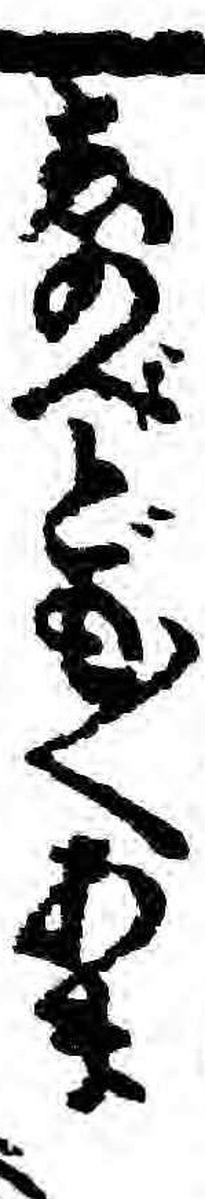しのべども〳〵あま
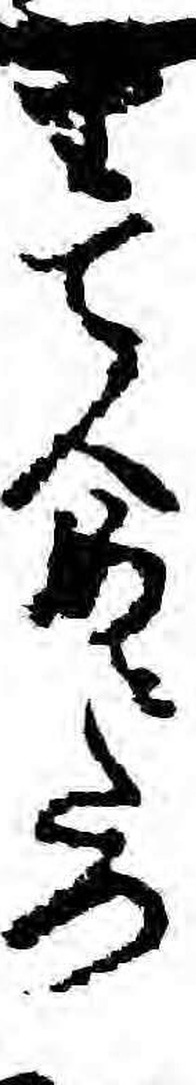りて人めにたつ
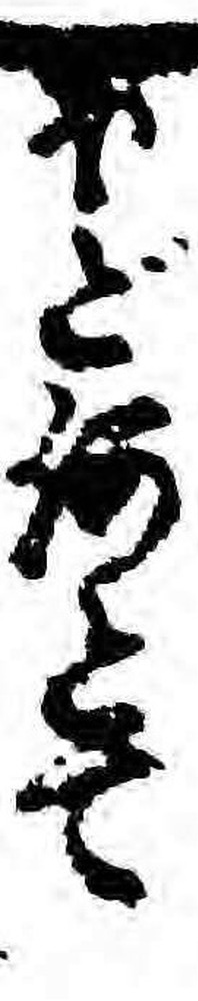ほど何とて
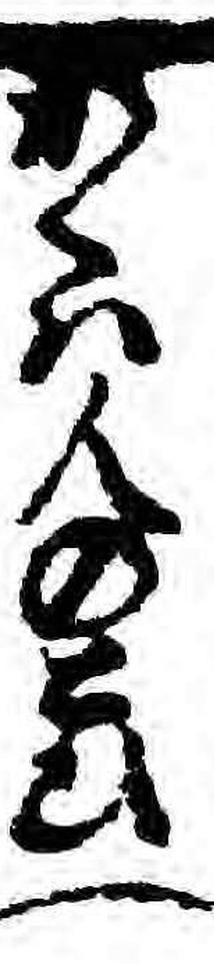かくは人のこひ
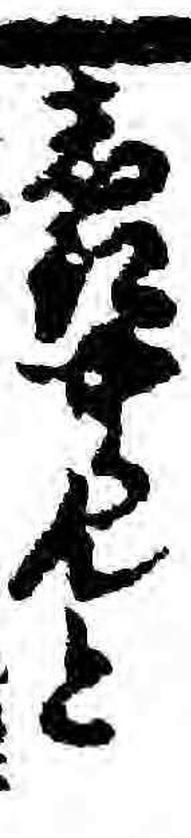しきやらんと
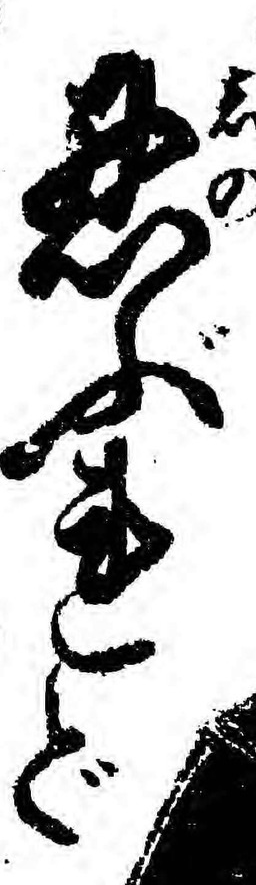忍ぶれど
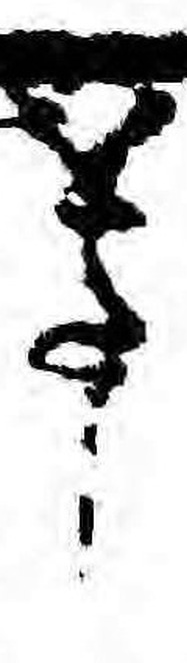をたし
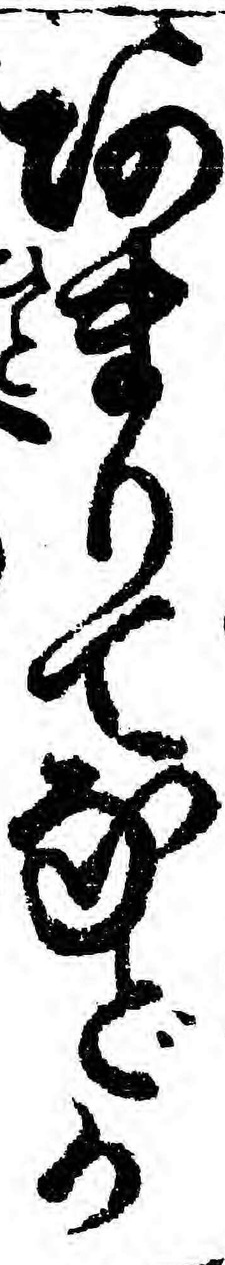あまりてなどか
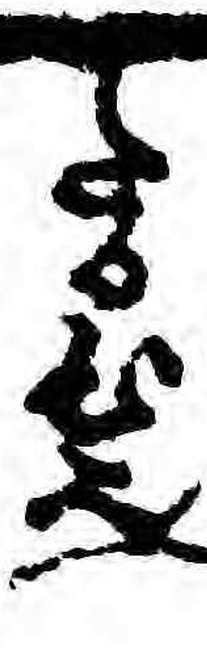たる心也
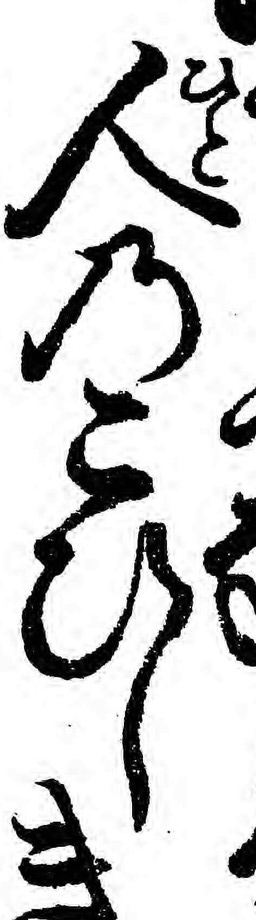人のこひしき

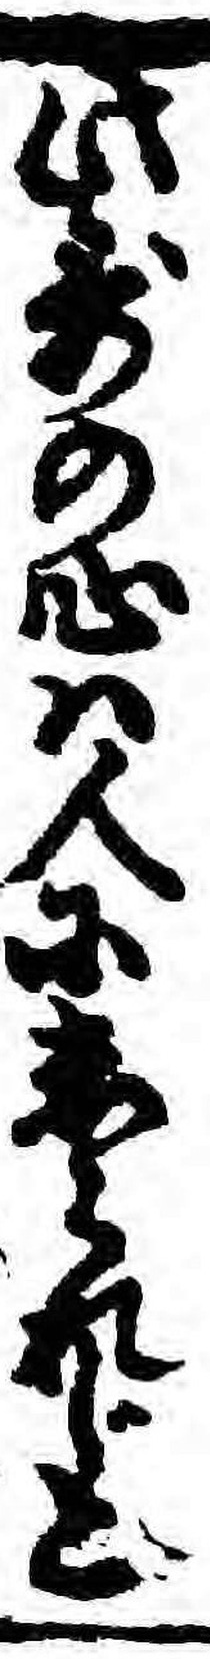此哥の心は人にしられじと
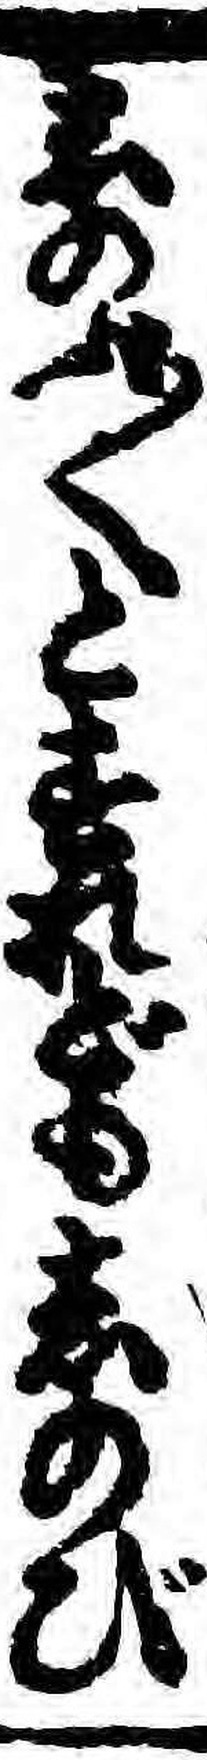しのぶ〳〵とすれどもしのび
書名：頭書和歌注譯／壽賀多百人一首小倉錦
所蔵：国文学研究資料館
